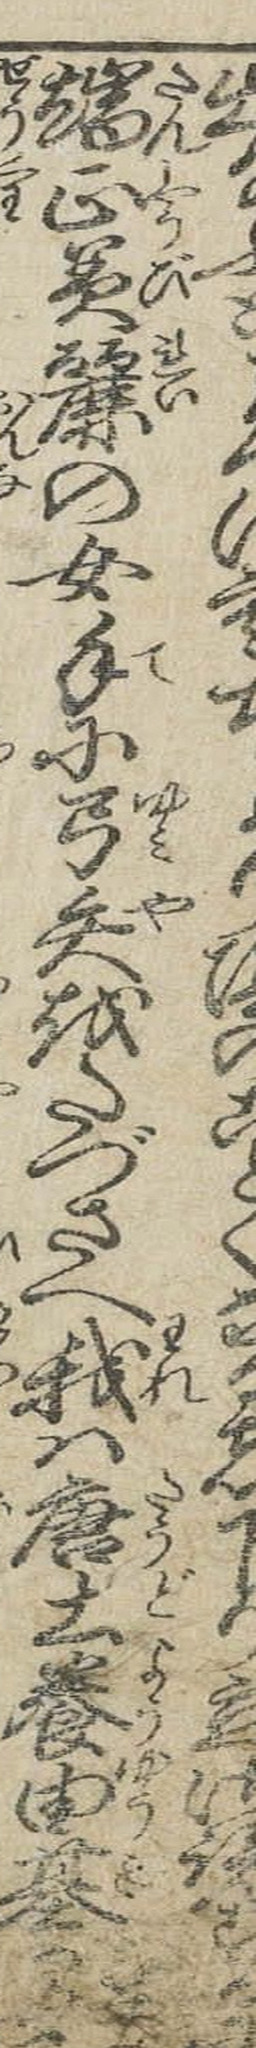端正美麗の女手に弓矢をたづさへ我は唐土養由基が女
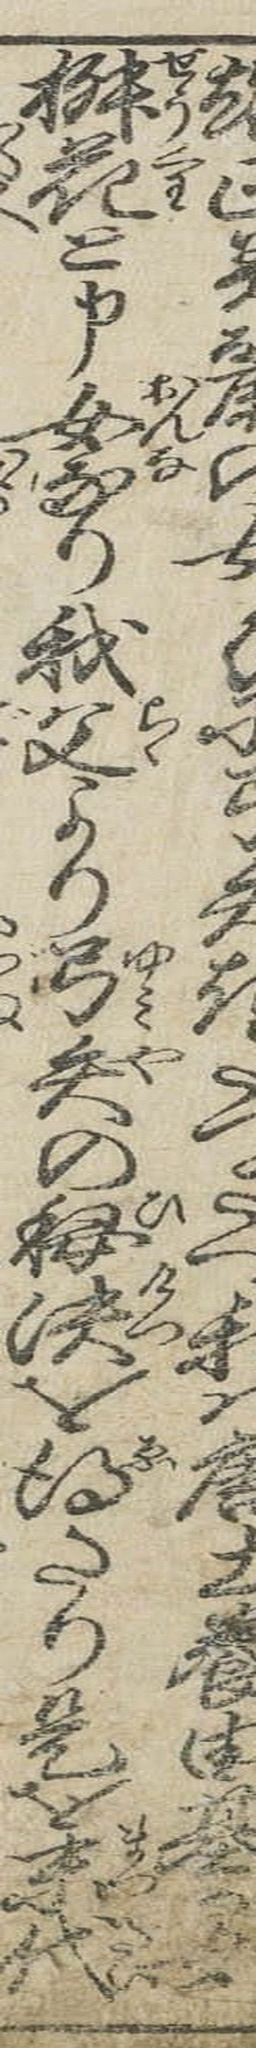抍花と申女なり我父より弓矢の秘決を得たり是を末代
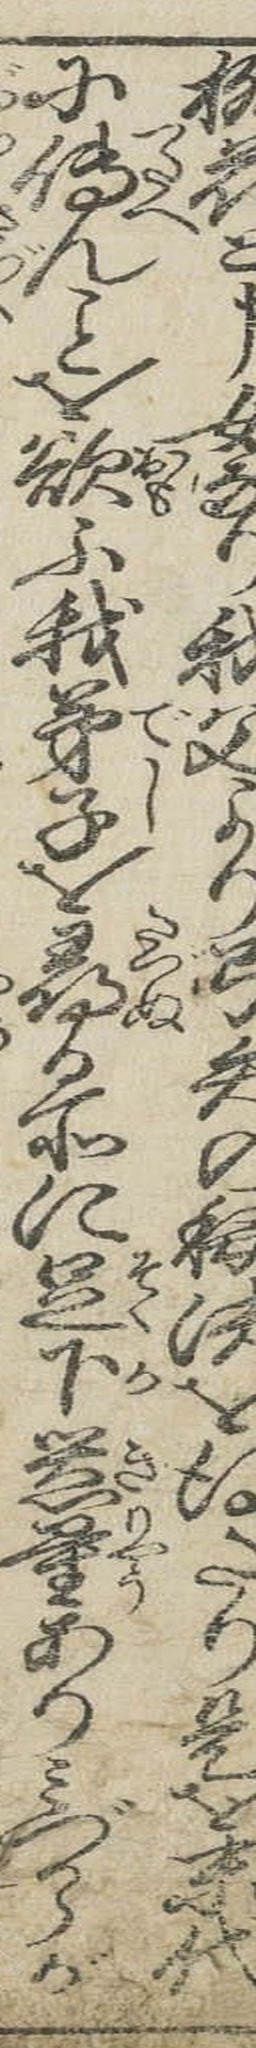に伝んことを欲ふ我弟子を尋る所に足下器量ありみづからが
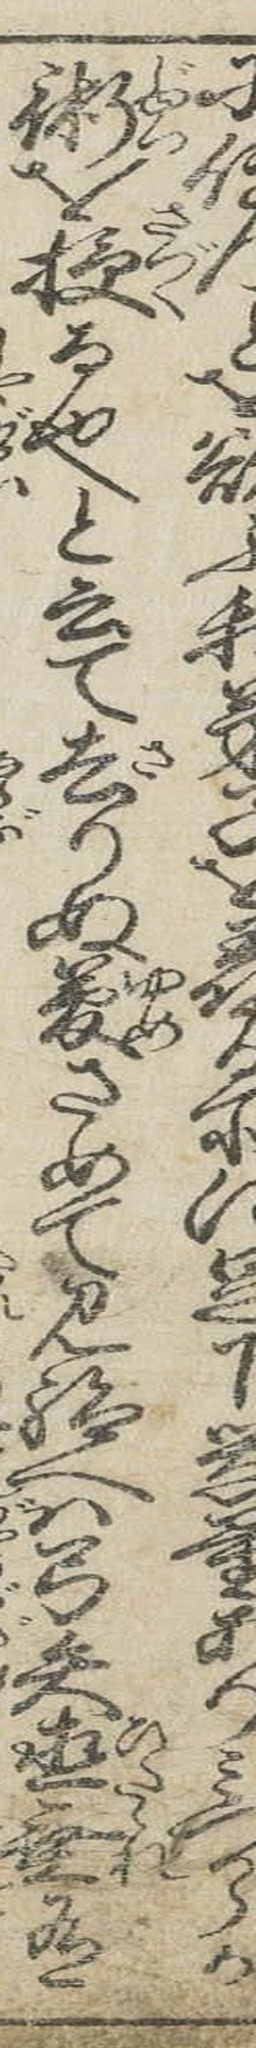術を授る也と云て去りぬ夢さめて見給へは弓矢直垂有
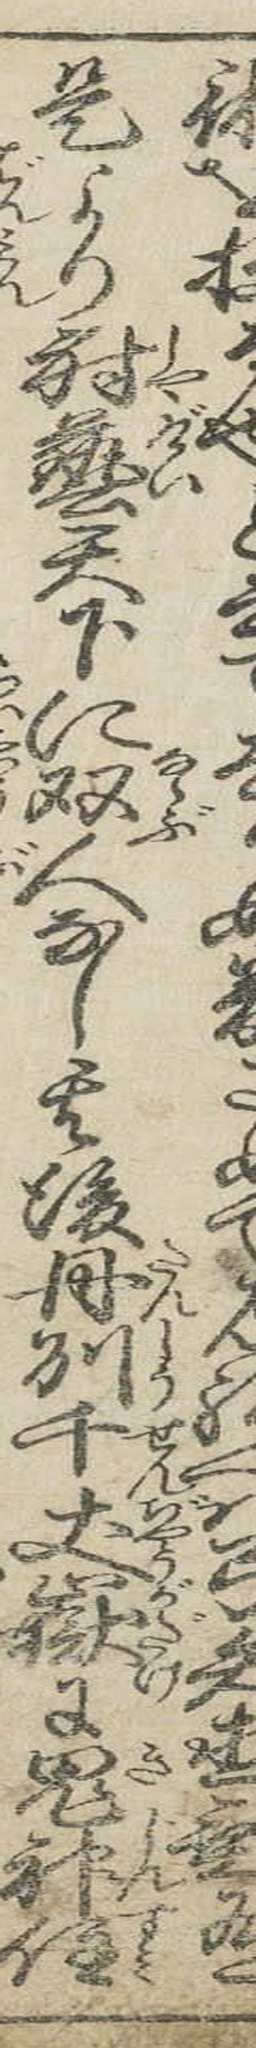是より射芸天下に双人なし其後丹州千丈嶽に鬼神住
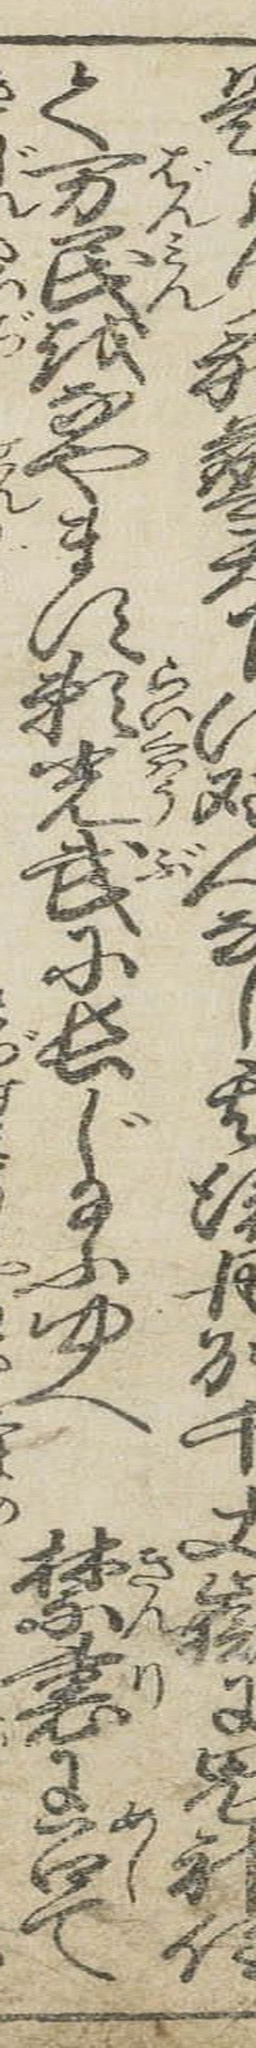て万民をなやます頼光武に長じ給ふゆへ禁裏に召て
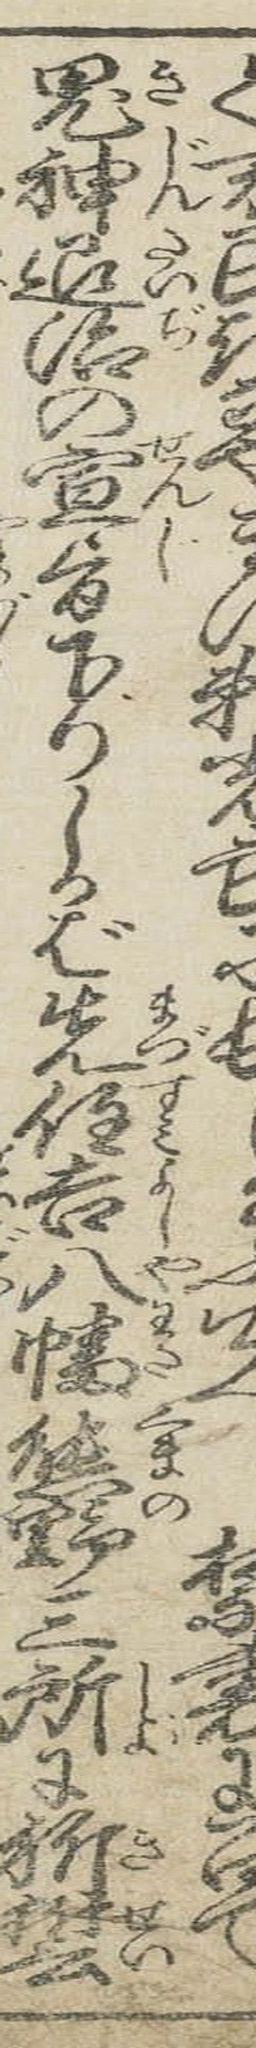鬼神退治の宣旨下りしかば先住吉八幡熊野三所に祈誓
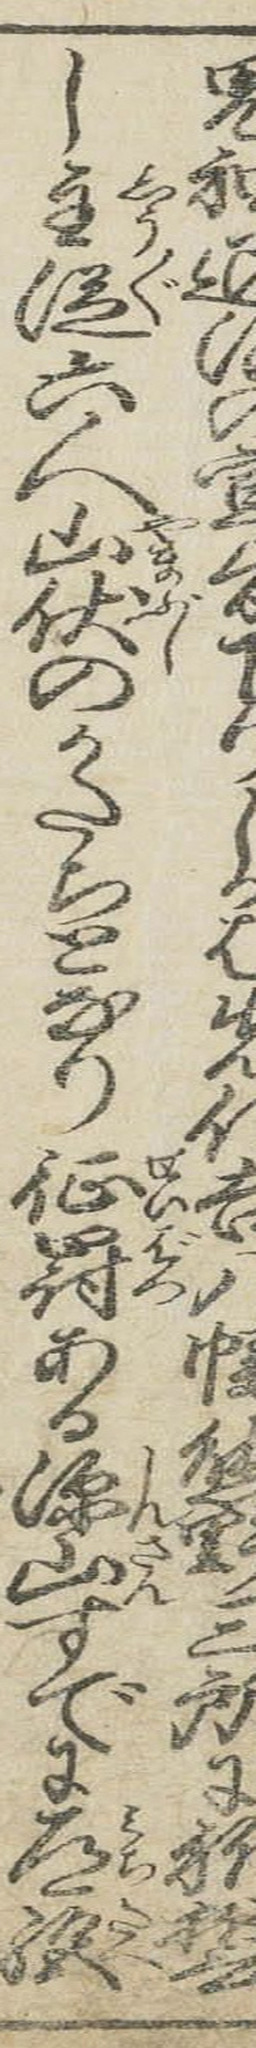し主従六人山伏のかたちとなり征罰ある深山すでに道絶
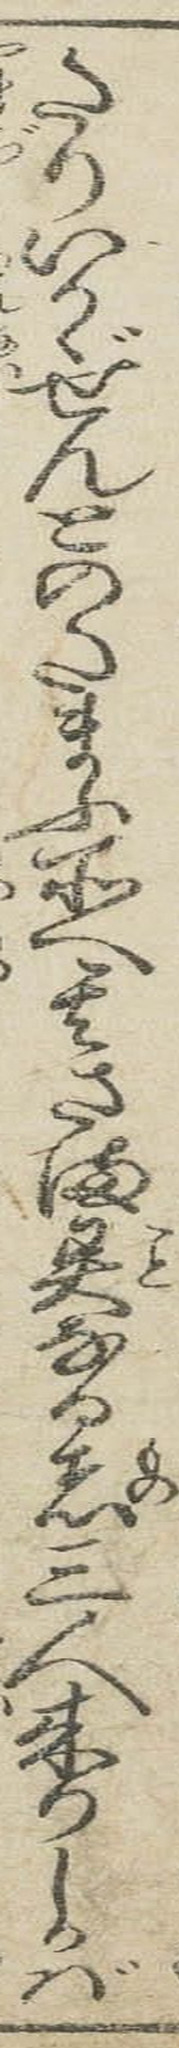たりいかゞせんとのたまふ所へ其さま異なる者三人来りしかば
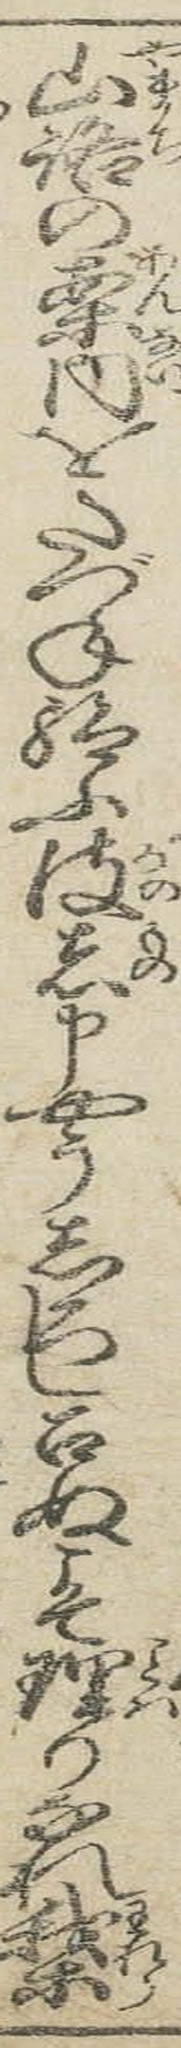山路の案内をたづね給ふ彼者申やうしろし召ぬこそ理りなれ我等
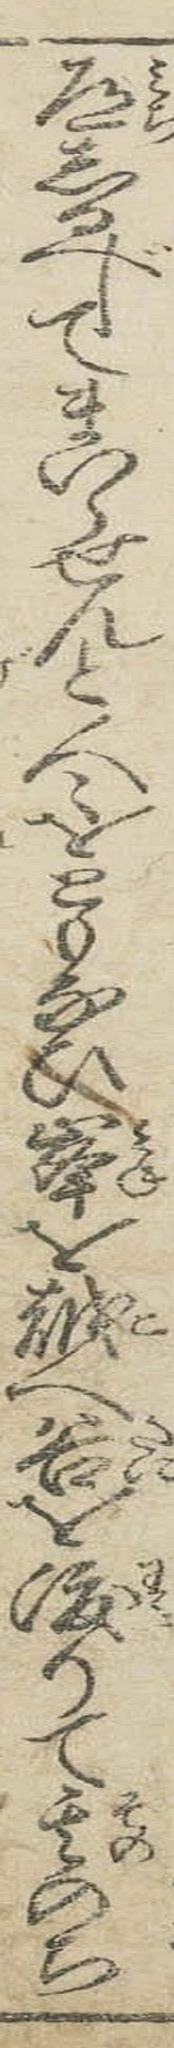道しるべしてまいらせんと人々をともなひ峯を越へ谷を渡りて其のち
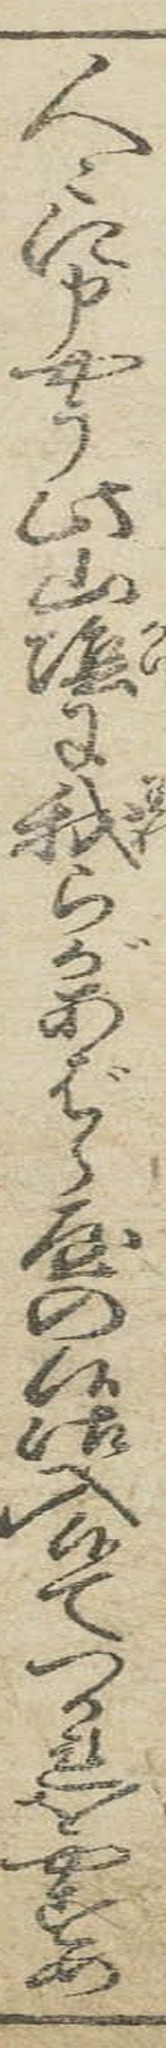人々に申やう此山蔭に我らがあばら屋の候御入候てつかれをやすめ
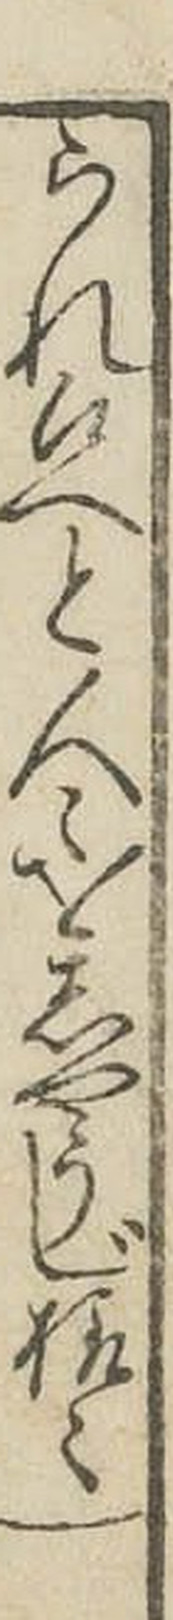られ候へと人々をしやうじ様々
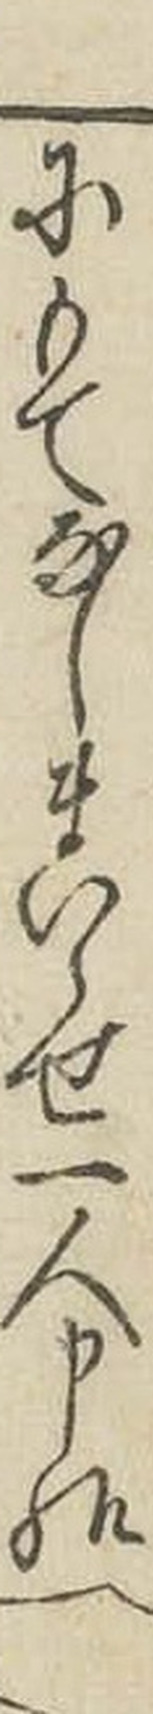にもてなしまいらせ一人申様
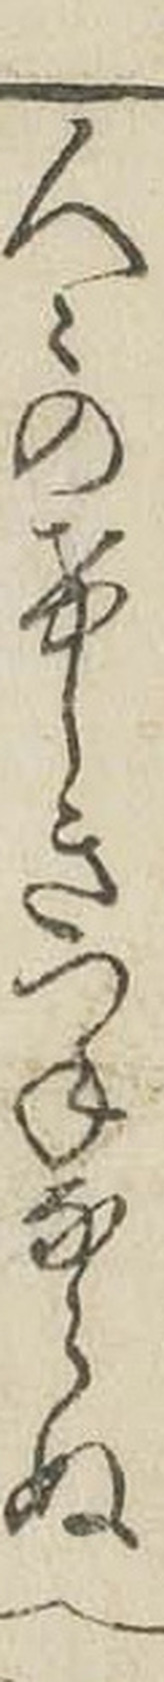人々のけしきつねならぬ
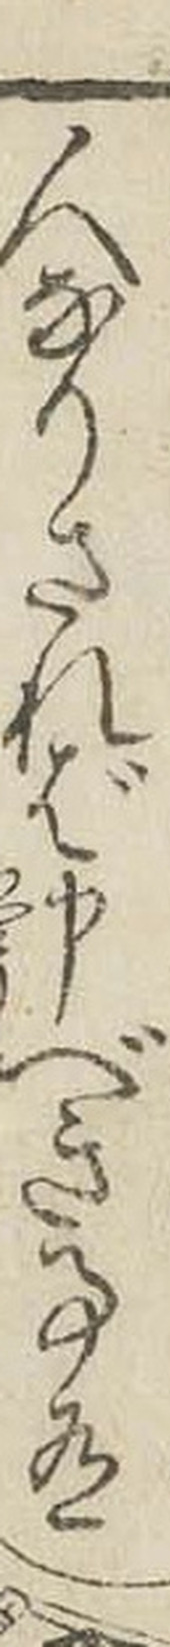人なりされば申べき事有
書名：絵本写宝袋 9巻 2之巻
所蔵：東京学芸大学教育コンテンツアーカイブ
